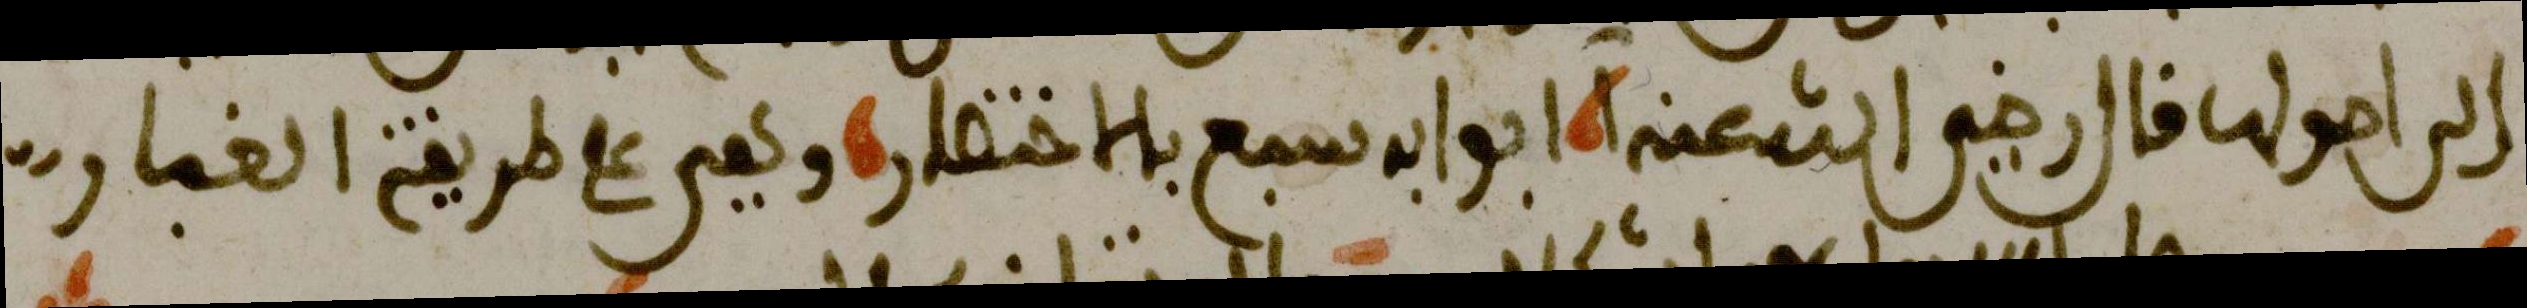الى اصولها قال رضي الله عنه ابوابه سبع بالاختصار وهي على طريقة الغبار
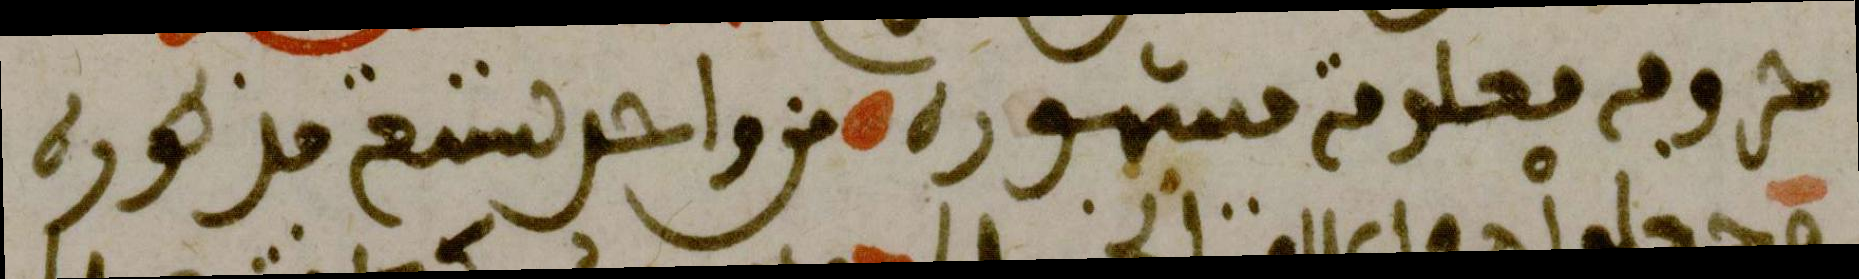حروفه معلومة مشهوره من واحد لتسعة مذكوره
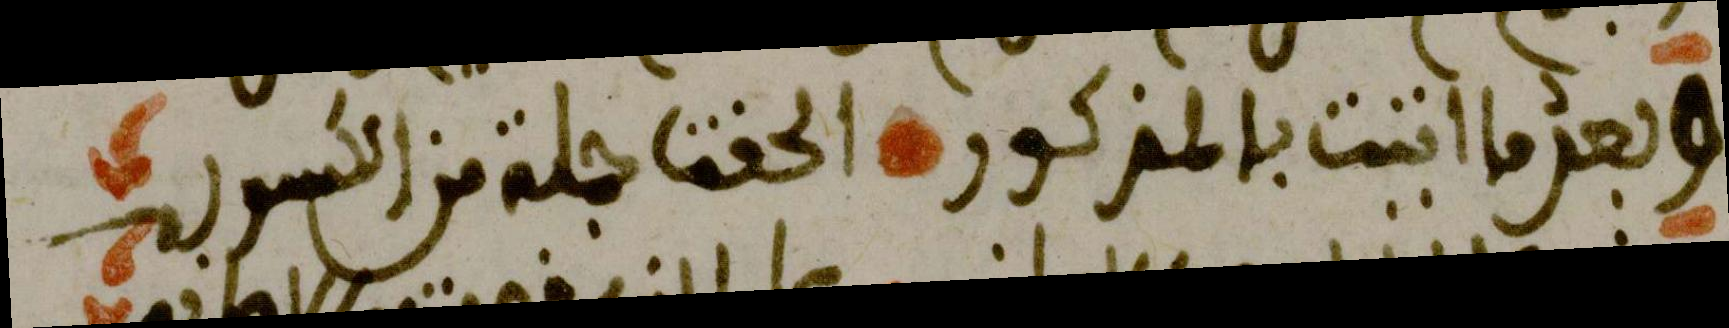وَبعدما اتيت بالمذكور الحقت جملة من الكسور
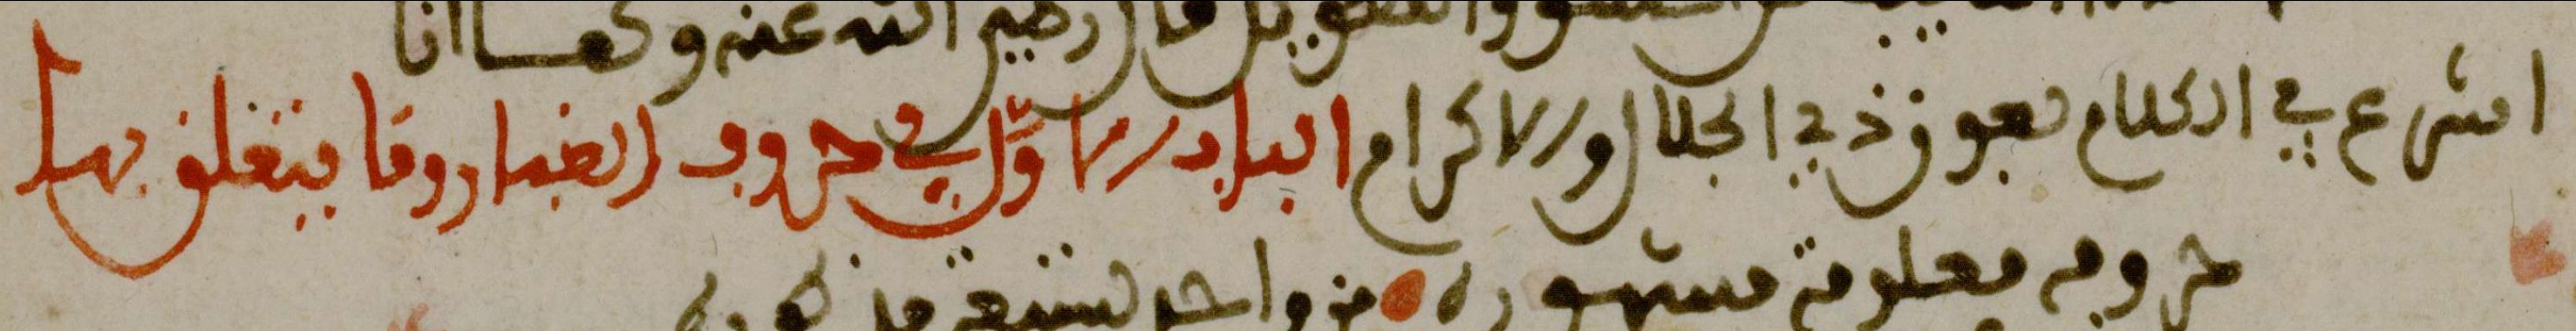اشرع في الكلام بعون ذي الجلال والاكرام الباب الاوّل في حروف الغبار ومَا يتعلق بها
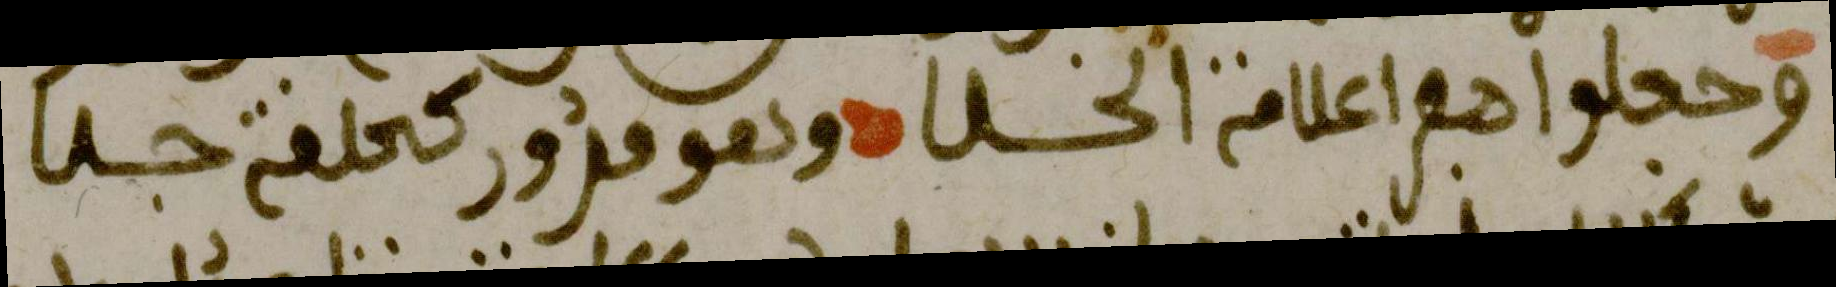وَجعلوا صفرا علامة الخلا وهو مدور كحلقة جلا
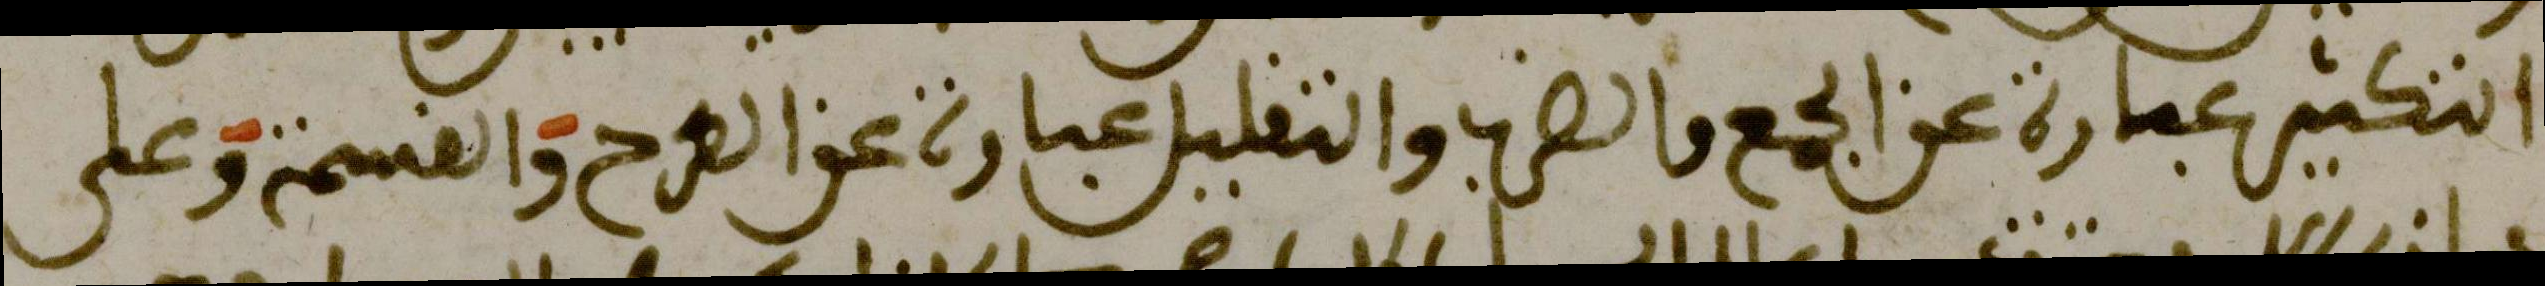التكثير عبارة عن الجمع والضرب والتقليل عبارة عن الطرح والقسمة وعلى
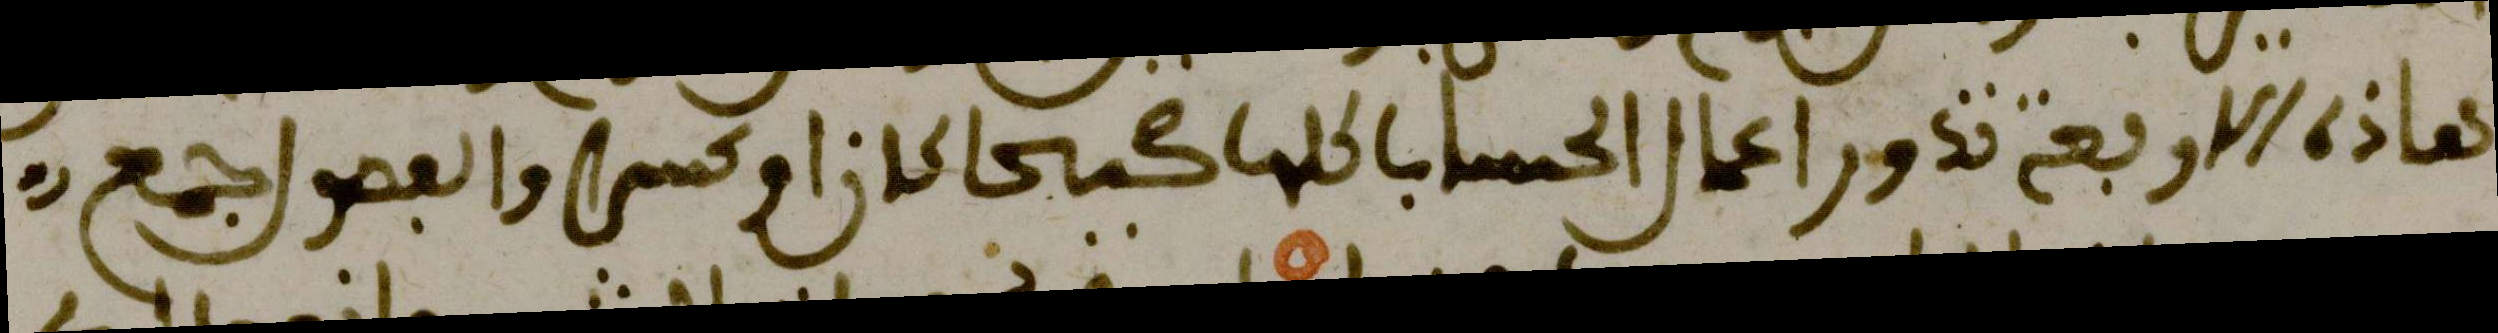هاذه الاربعة تدور اعمال الحساب كلها صحيحا كان او كسرا والفصول جمع
